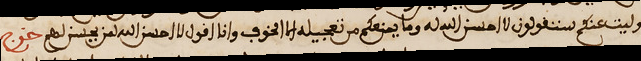وليت عنكم ستقولون لا احسن الله له وما يمنعكم من تعجيله الا الخوف انا اقول لا احسن الله لمن يحسن لهم خرج
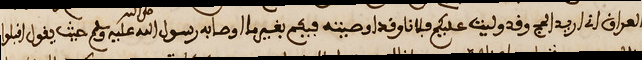العراق انى اريد الحج وقد وليت عليكم فلانا وقد اوصيته فيكم بغير ما اوصابه رسول الله عليه وسلم حيث يقول اقبلوا
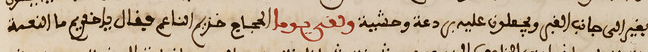بغير الى جانب القبر يجعلون عليه بردعة حشية ولقى يوما الحجاج خزيم الناعم فقال يا خزيم ما النعمة
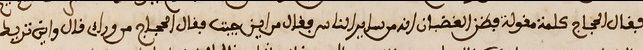فقال الحجاج كلمة مقولة فظن الغضبان انه من ساير الناس فقال من اين جيت فقال الحجاج من وراءى قال واين تريد
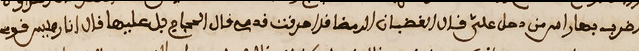اضرب بها راس من دحل على قال الغضبان الرمضا قد احرقت قد مى قال الحجاج بل عليها قال ان ريس قومى
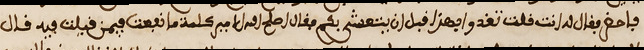فاحضر فقال له انت قلت تغدوا بهذا قبل ان يتعشى بكم فقال اصلح الله الامير كلمة ما نفعت فيمن قيلت فيه قال
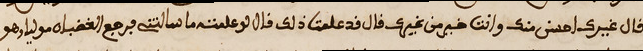قال غيرك احسن منك وانت خير من غيرك قال قد علمت ذلك قال لو علمته ما سالتنى فرجع الغضبان موليا وهو
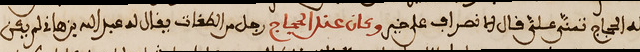له الحجاج تمنى على قال الانصراف على خير وكان عبد الحجاج رجل من الطغات يقال له عبد الله بن هانى لم يكن
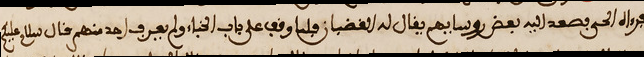فرءاه الحى فصعد اليه بعض روسايهم يقال له الغضبان فلما وقف على باب الخباء ولم يعرف احد منهم قال سلام عليكم
